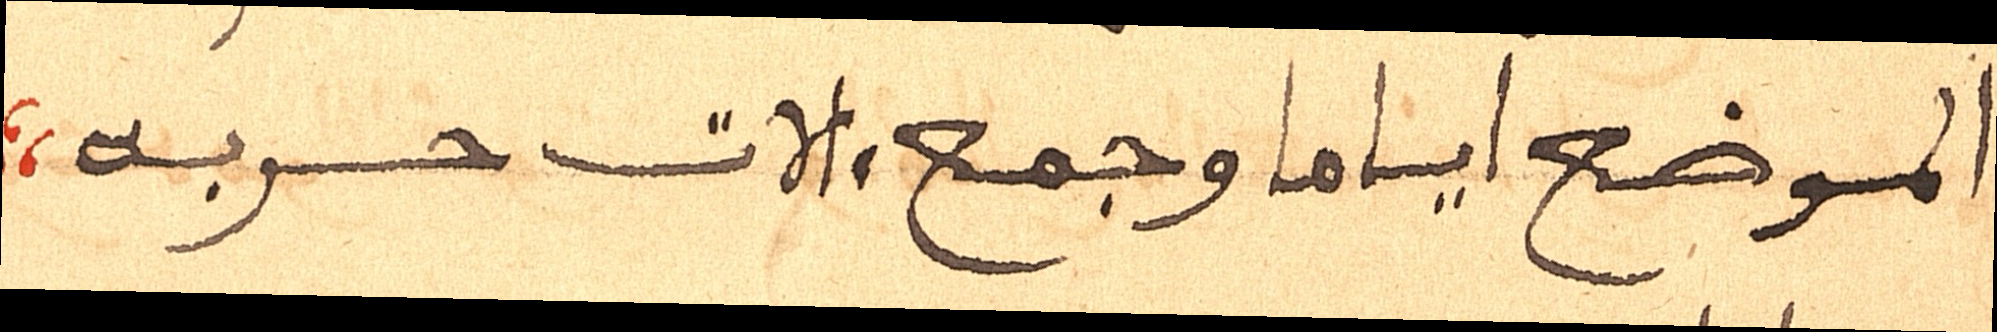الموضع اياما وجمع ءالات حربه
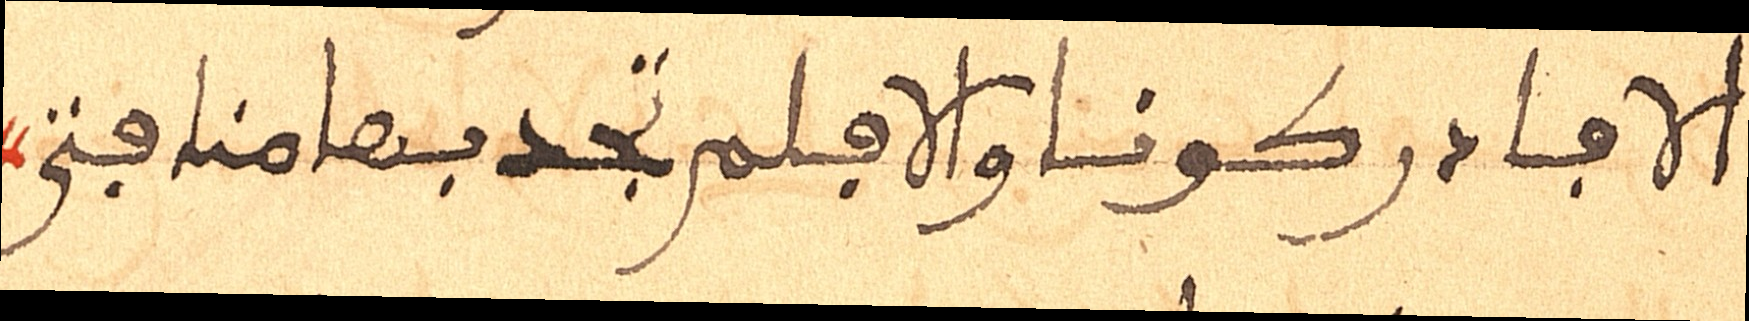الافاد ركونا والافلم تجدبها منا فتى
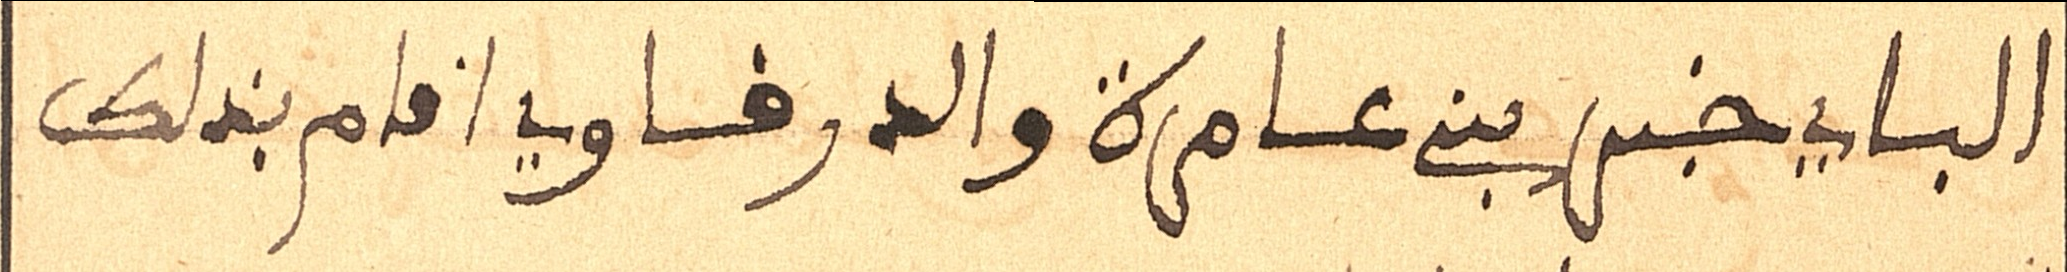الباي خبر بنى عامرة والدرقاوي اقام بذلك
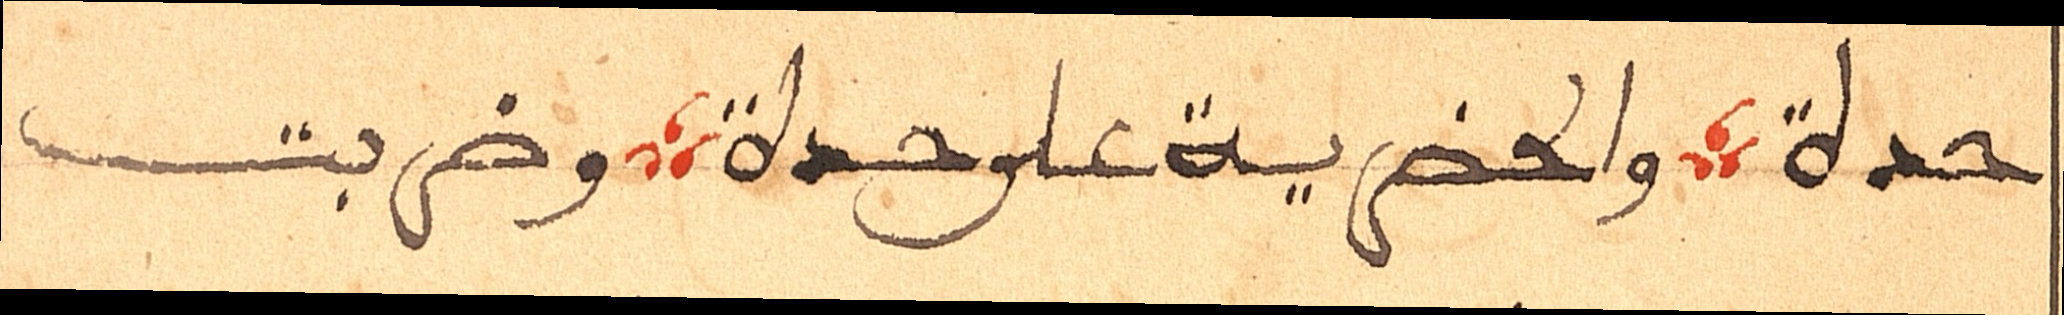حدة والحضرية على حدة وضربت
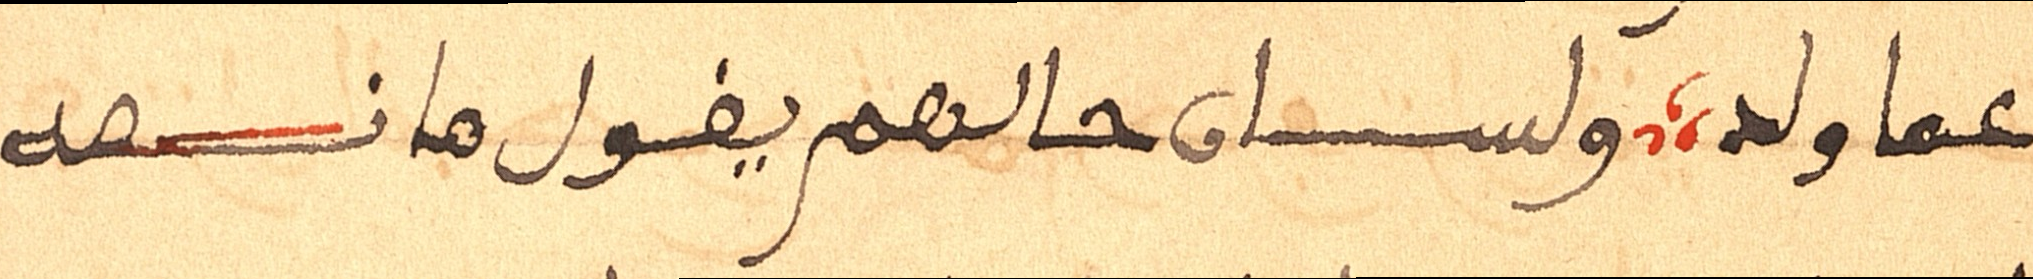عما ولد ولسان حالهم يقول ما نصه
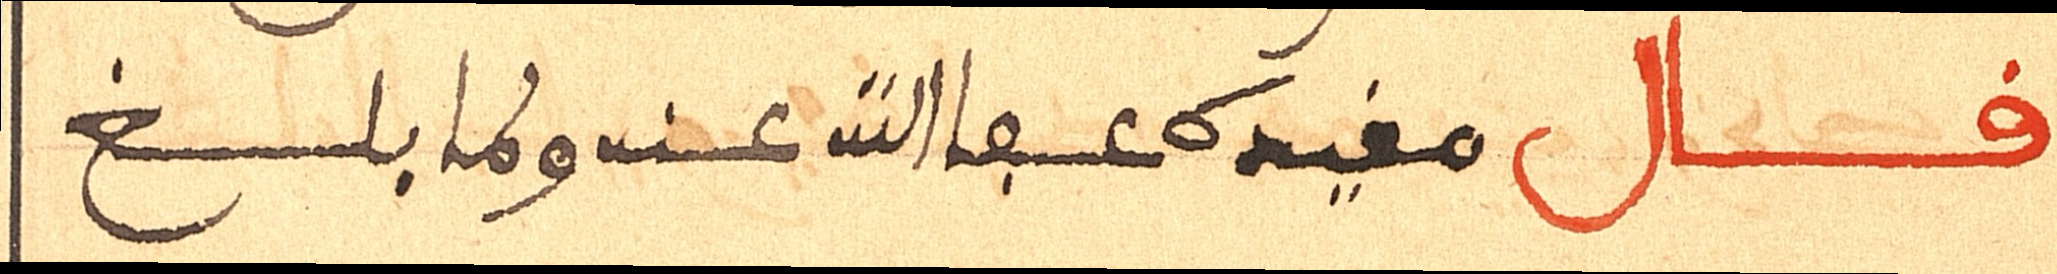قال مقيده عفا الله عنه ولما بلغ
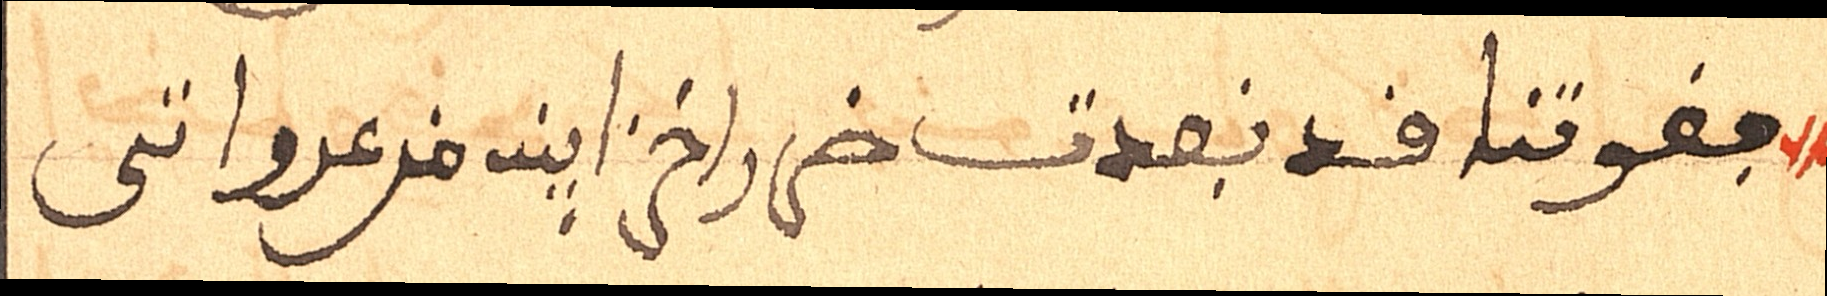فقوتنا قد نفدت ضررا خزائنه من غرو اتى
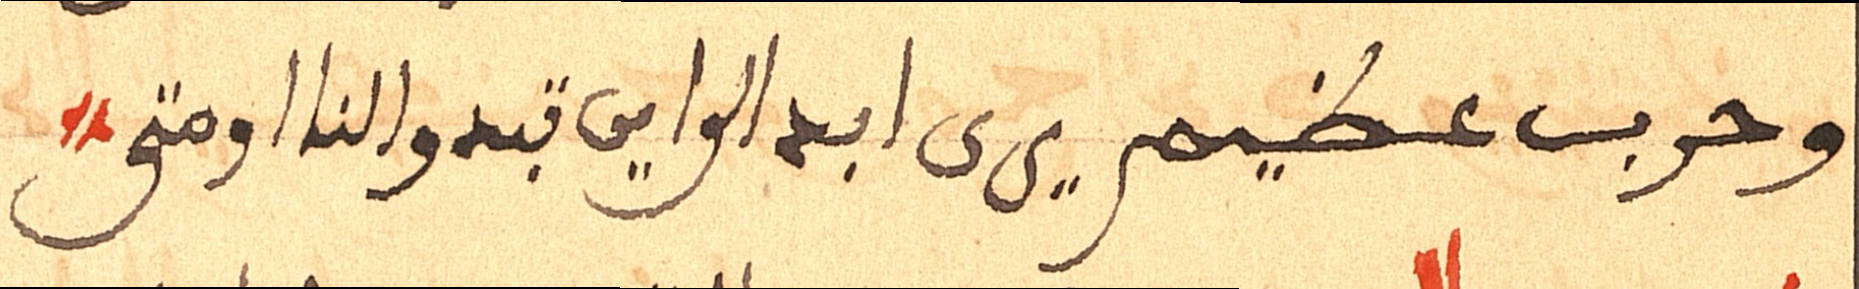وحرب عظيم يرى ابد الى اين تبدو النااو متى
